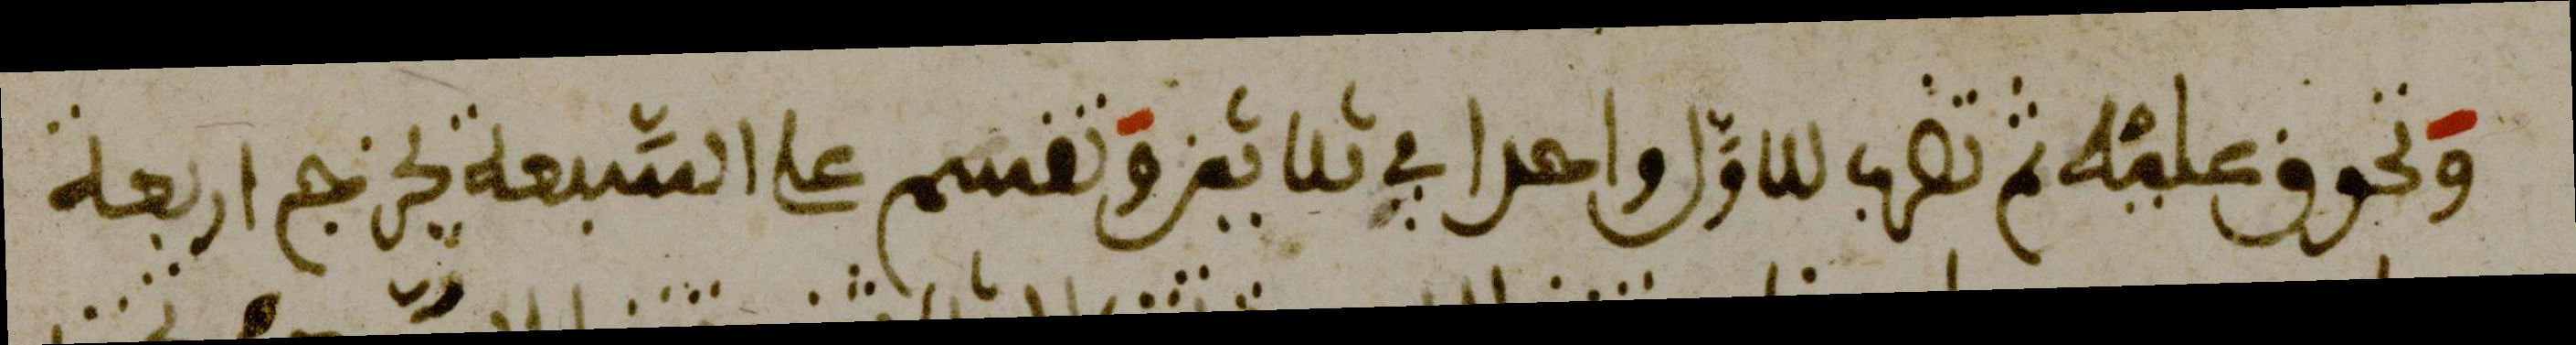وَتحوق عليْه ثم تضرب للاول واحدا في ثلاثين وتقشم على السّبعة يخرج اربعة
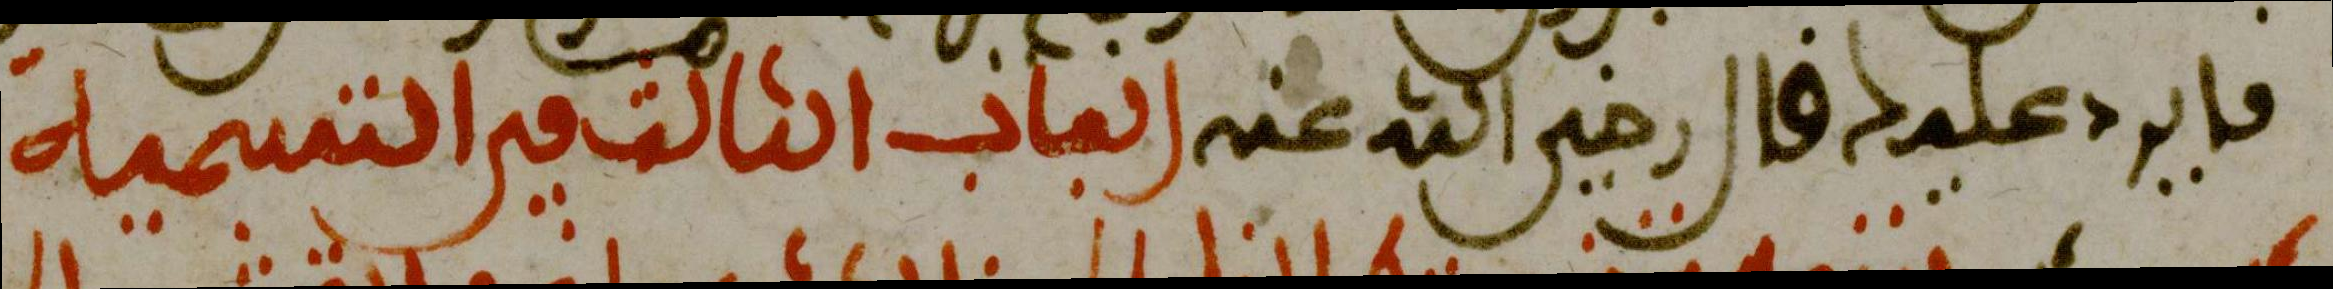ما يرد عليك قال رضي الله عنه الباب الثالث في التسمية
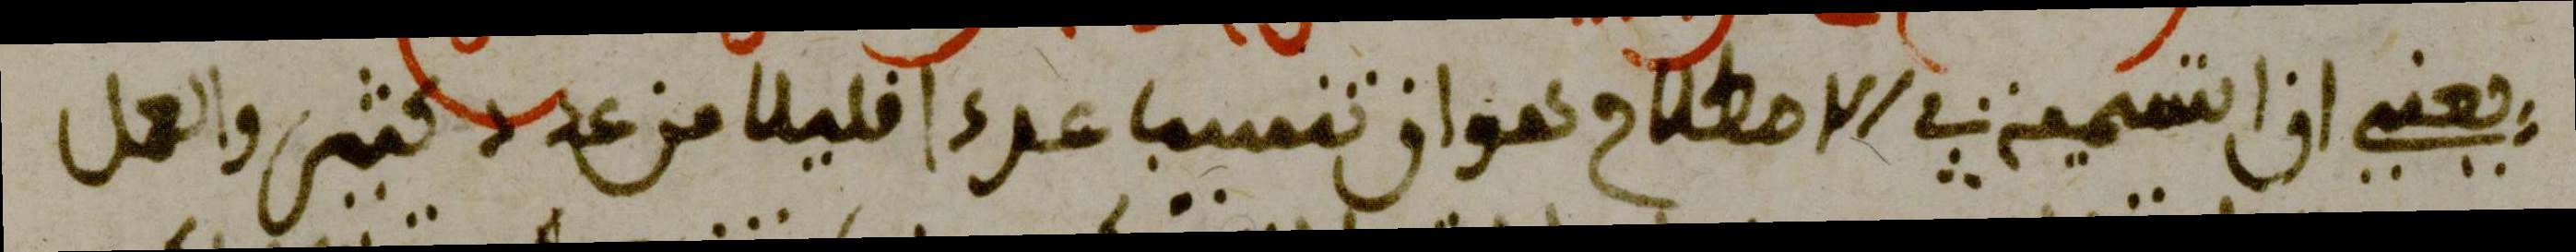يعني ان التسمية في الاصطلاح هو ان تنسب عددا قليلا من عدد كثير والعمل
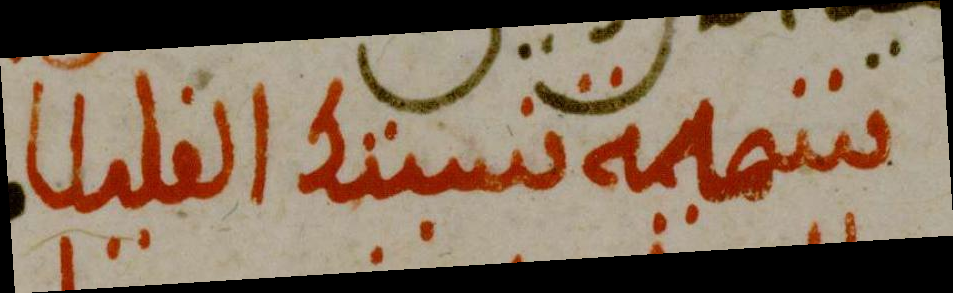تسمية نسبتك القليلا
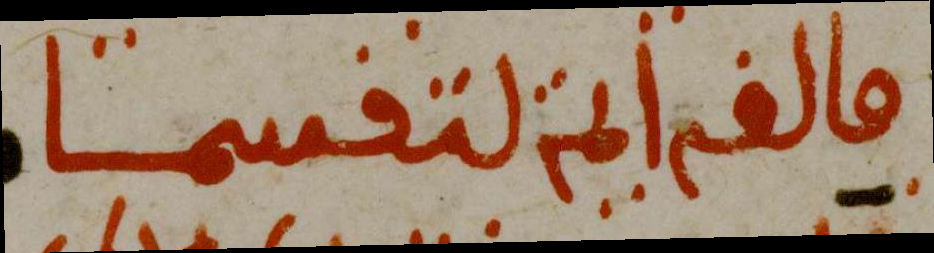فالقه ايمة لتقسما
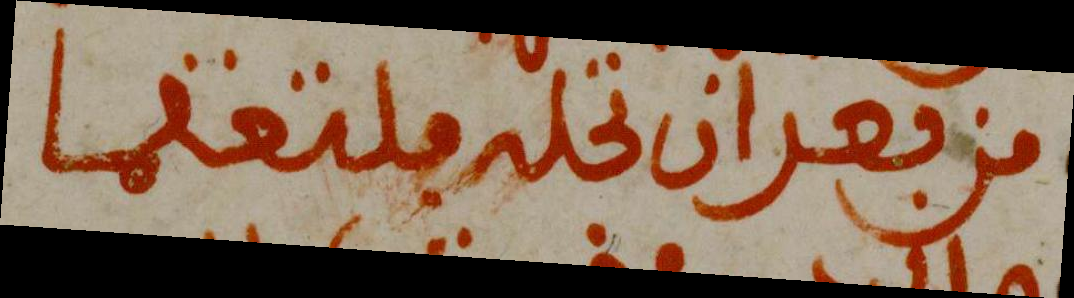من بعد ان تحله فلتعهما
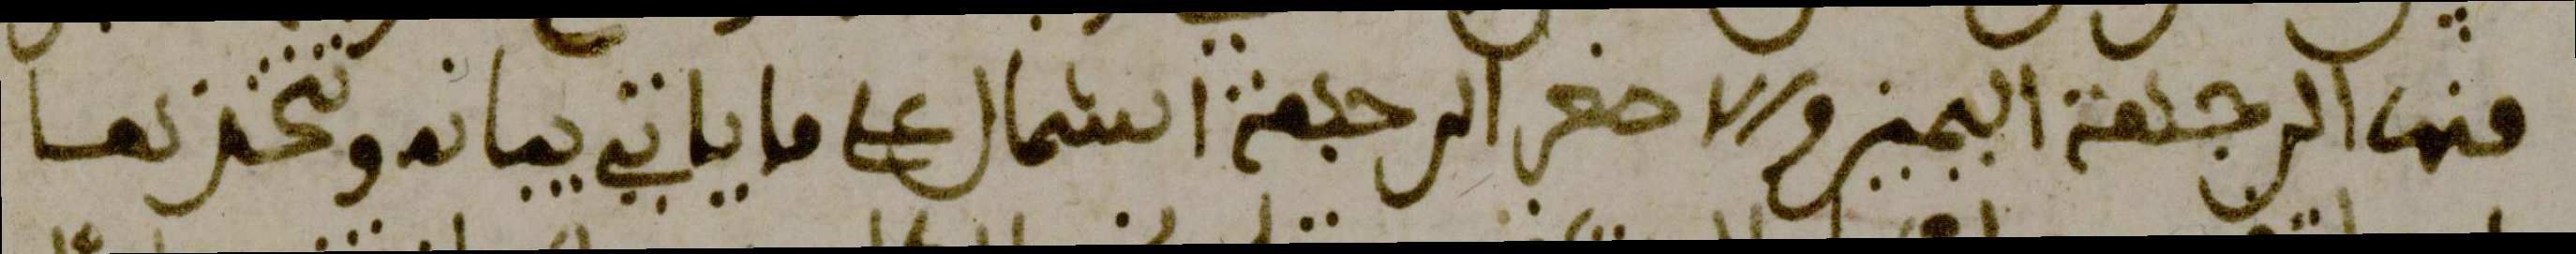منها الى جهة اليمين والاصغر الى جهة اشمال على ما ياتي بيانه وتتخذها
